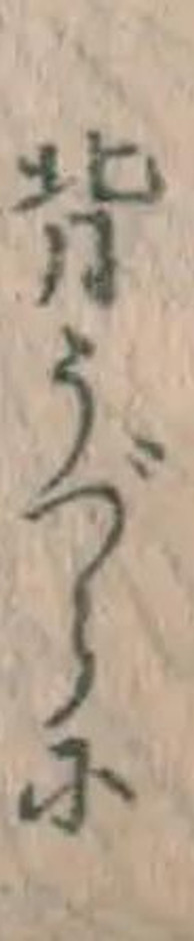背うづらに
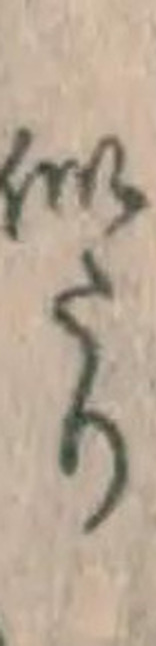似たり
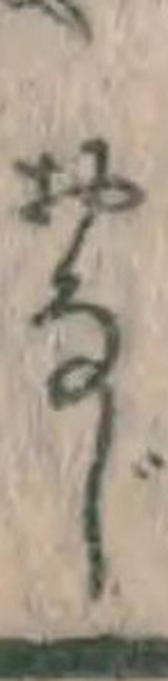おなじ
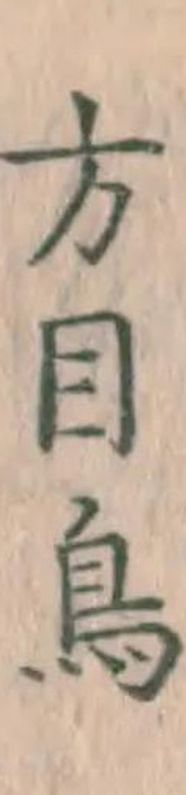方目鳥
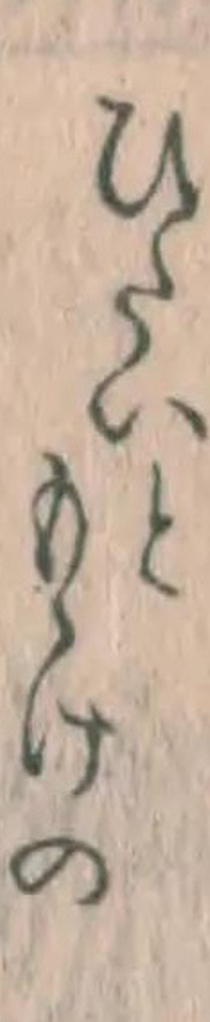ひたいともゝけの
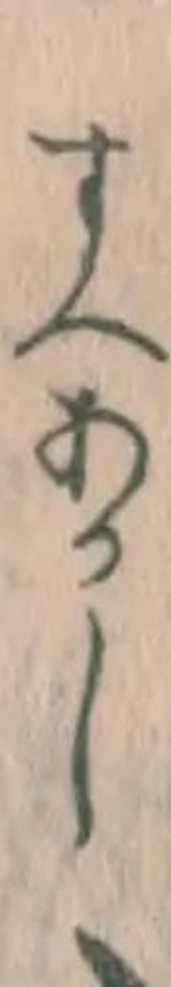すへあかし
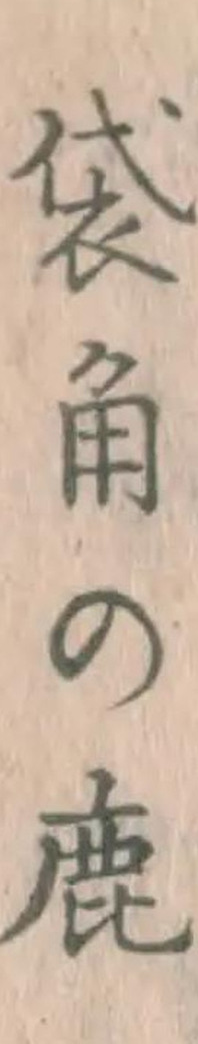袋角の鹿
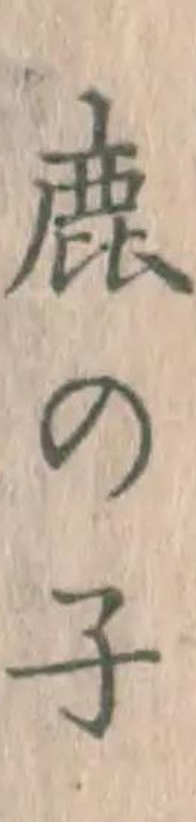鹿の子

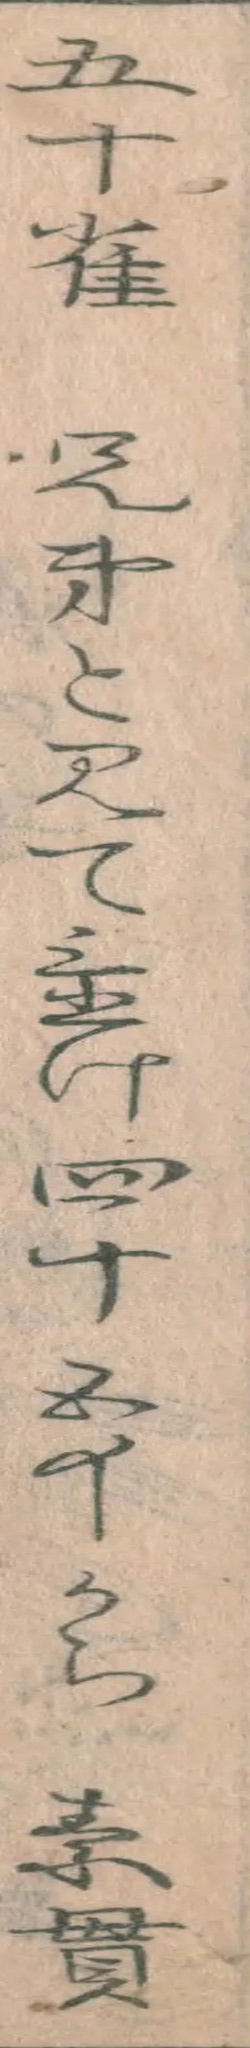五十雀兄弟と見て置け四十五十から素貫
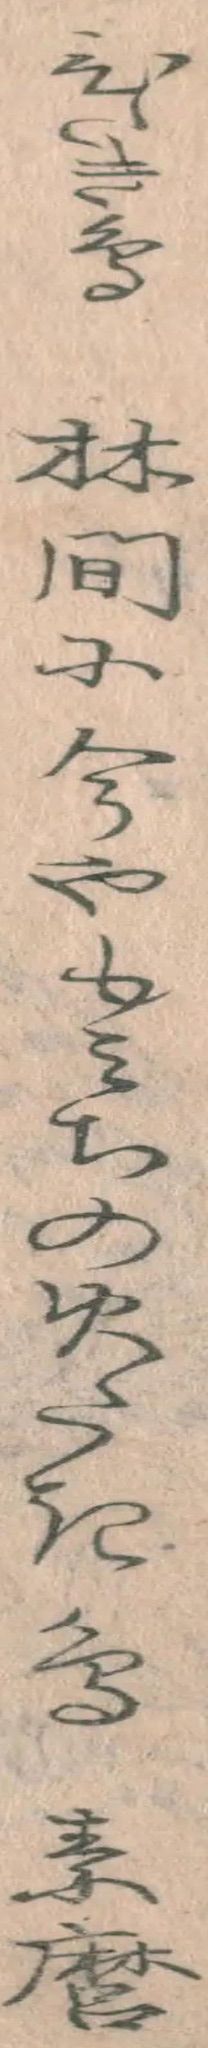ひたき鳥林間に今やもみちの火たき鳥素麿
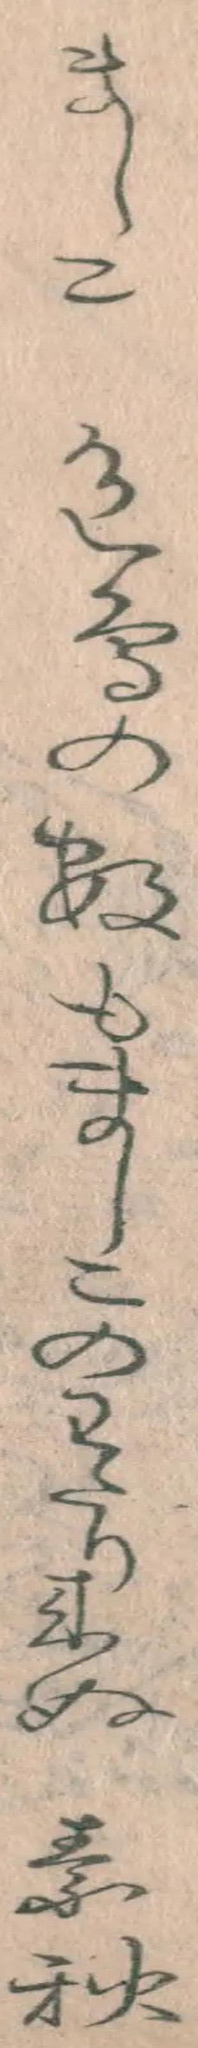ましこ色鳥の数もましこのわたり来ぬ素秋
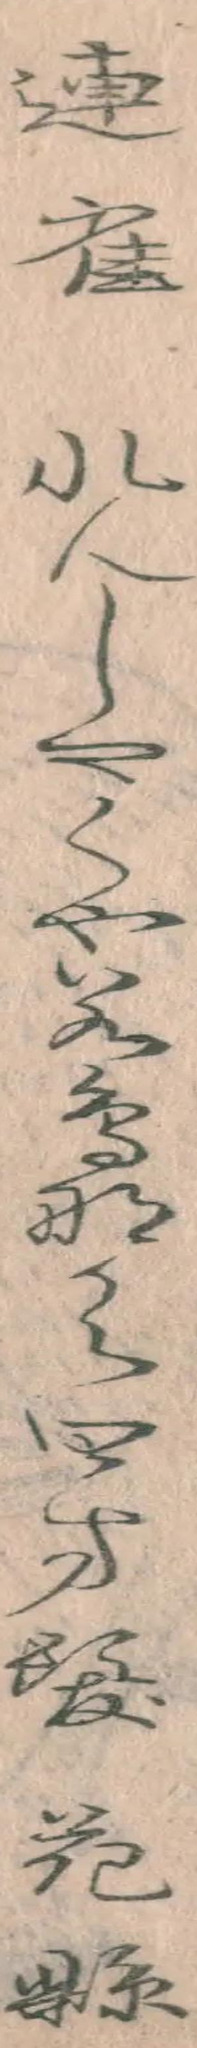連雀れんしやくや若鳥なから四方髪花縣
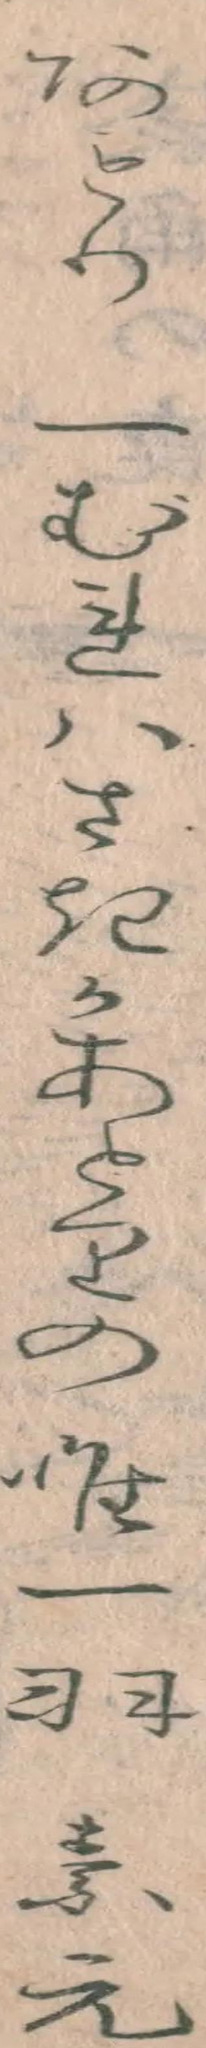あとり一むれはさきかあとりの唯一羽素元
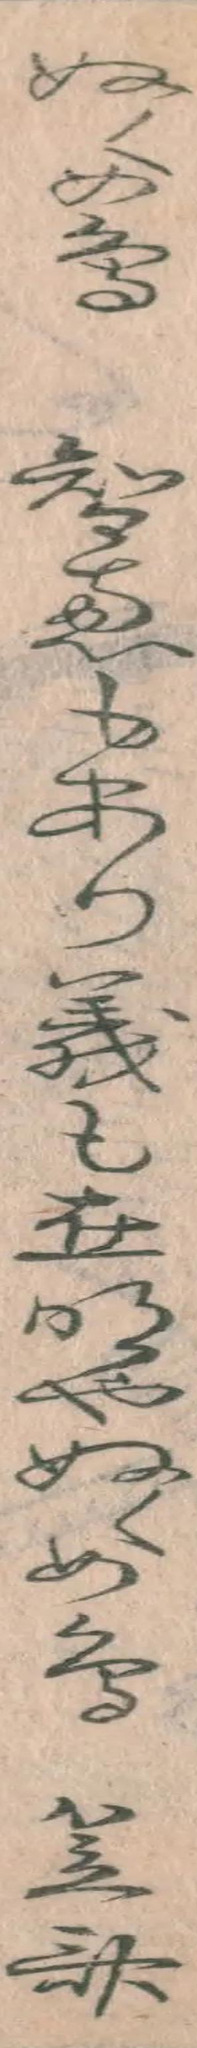ぬくめ鳥知恵もあり義も在明やぬくめ鳥笠齋
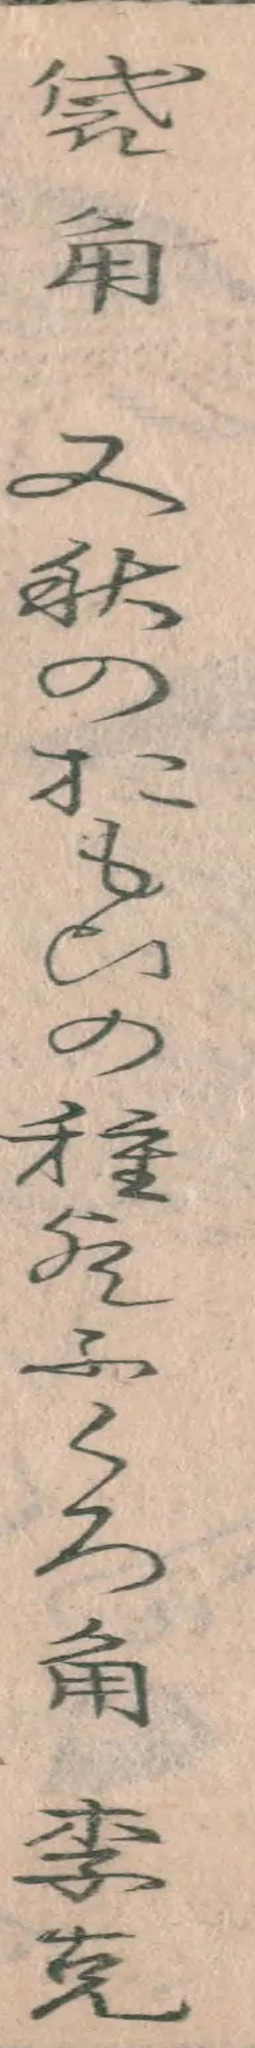袋角又秋のおもひの種やふくろ角李克
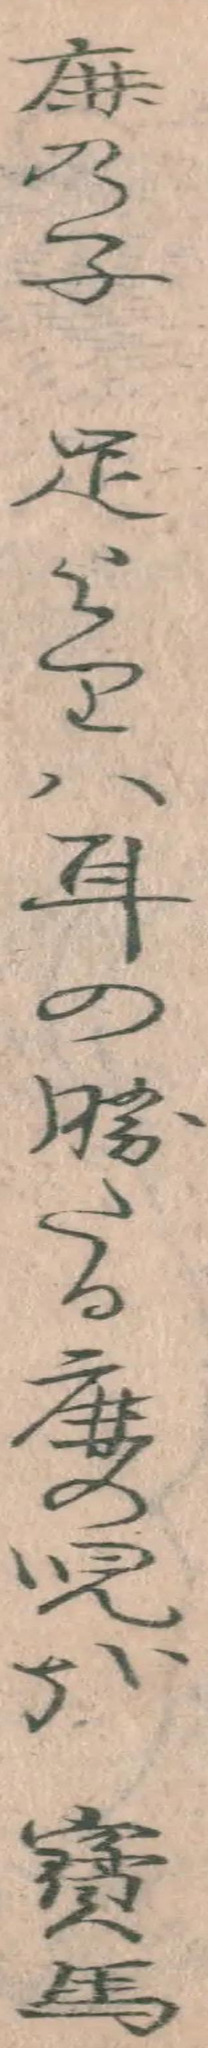鹿の子足よりは耳の勝たる鹿の児哉寶馬
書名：誹諧名知折 2巻. [2]
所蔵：国立国会図書館 National Diet Library, JAPAN
